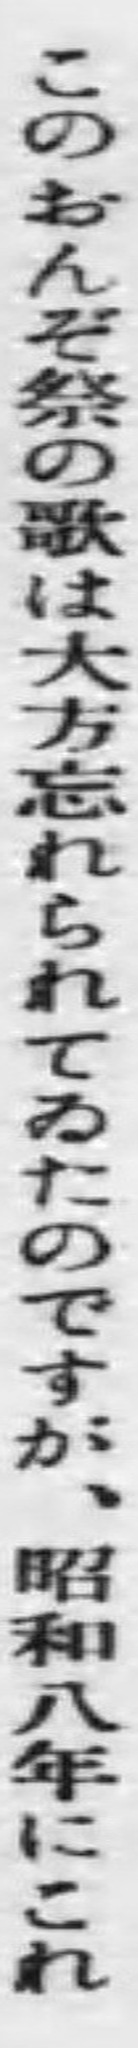このおんぞ祭の歌は大方忘れられてゐたのですが、昭和八年にこれ
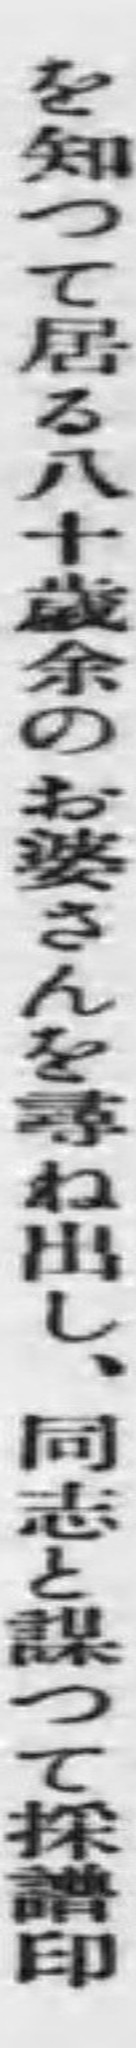を知つて居る八十歳余のお婆さんを尋ね出し、同志と謀つて採譜印
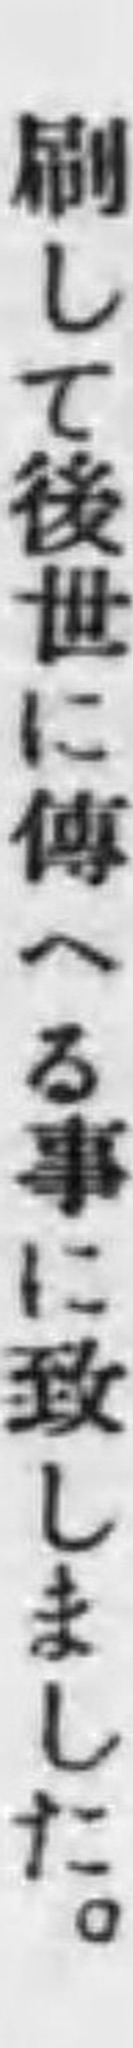刷して後世に伝へる事に致しました。
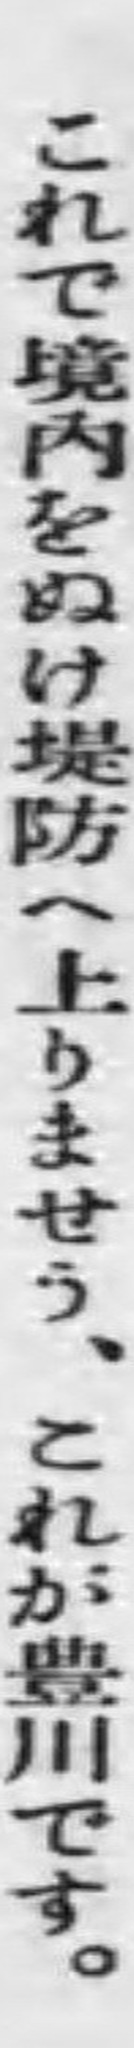これで境内をぬけ堤防へ上りませう、これが豊川です。
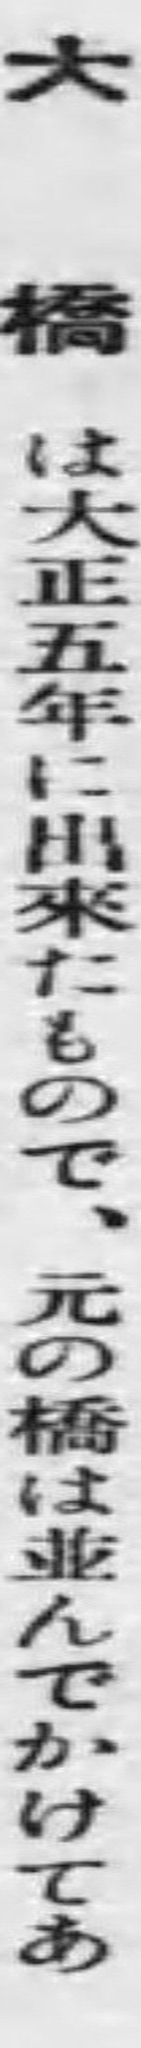大橋は大正五年に出来たもので、元の橋は並んでかけてあ
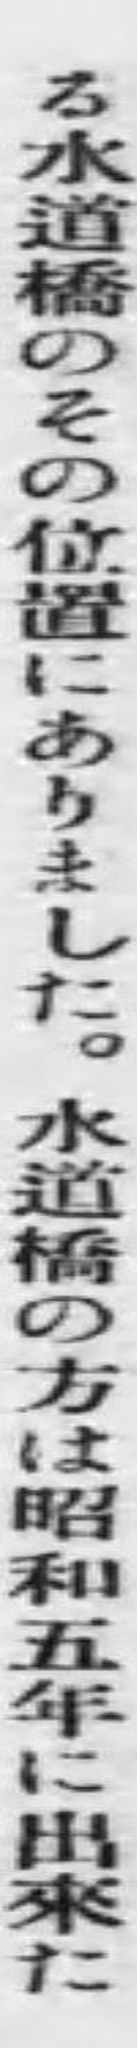る水道橋のその位置にありました。水道橋の方は昭和五年に出来た
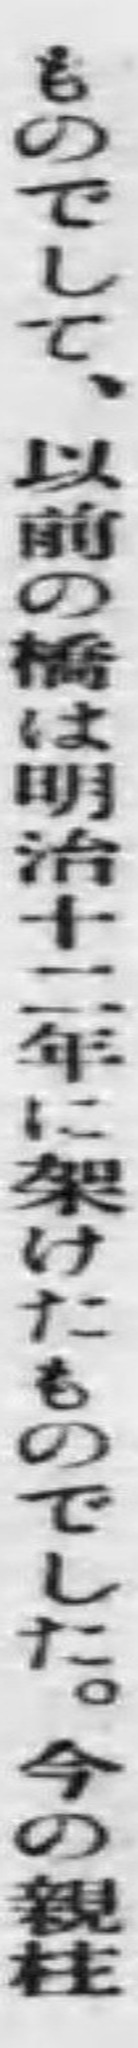ものでして、以前の橋は明治十二年に架けたものでした。今の親柱
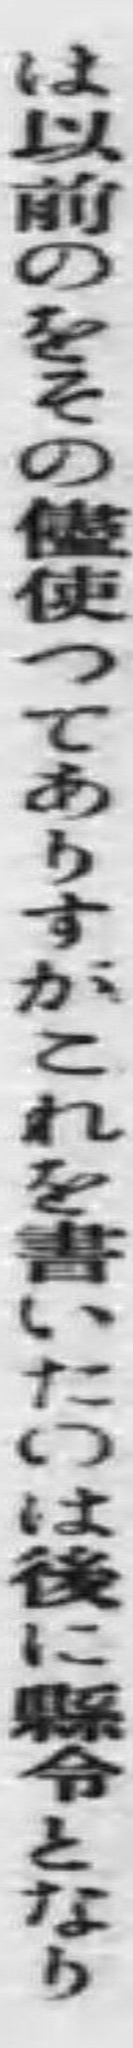は以前のをその儘使つてありすがこれを書いたのは後に県令となり
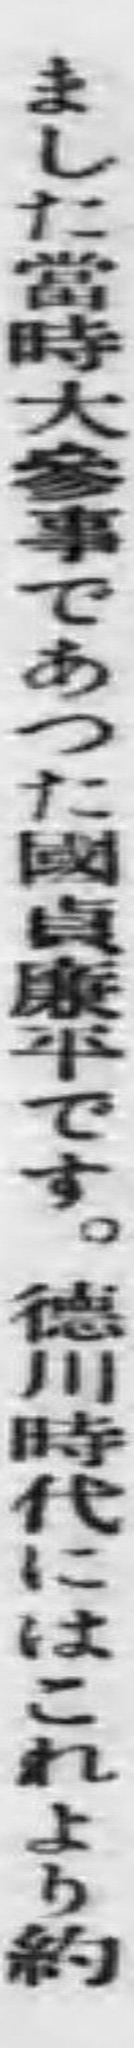ました当時大参事であつた国貞廉平です。徳川時代にはこれより約
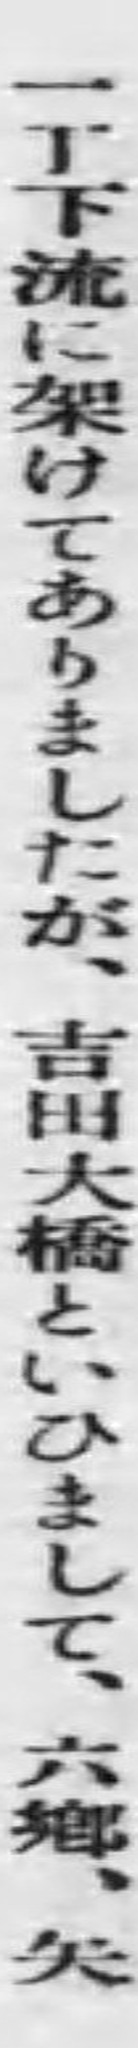一丁下流に架けてありましたが、吉田大橋といひまして、六郷、矢
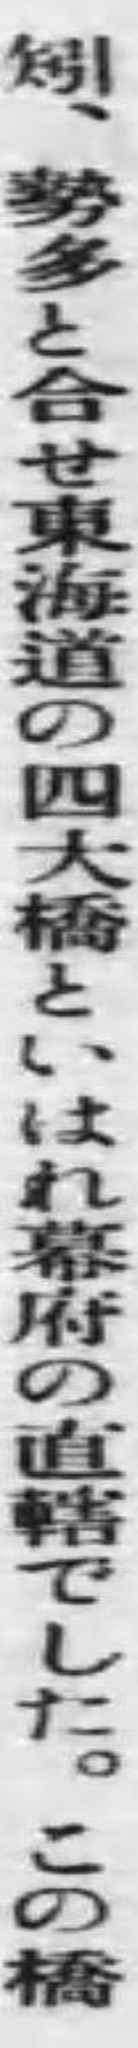矧、勢多と合せ東海道の四大橋といはれ幕府の直轄でした。この橋
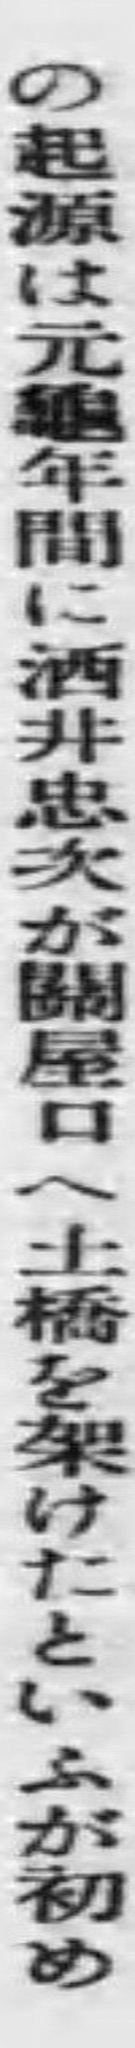の起源は元亀年間に酒井忠次が関屋口へ土橋を架けたといふが初め
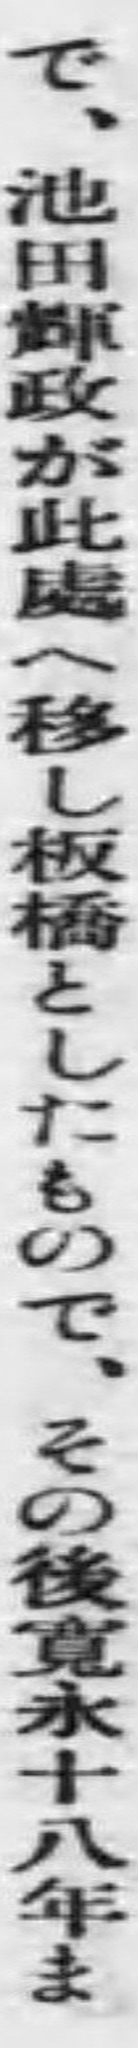で、池田輝政が此処へ移し板橋としたもので、その後寛永十八年ま
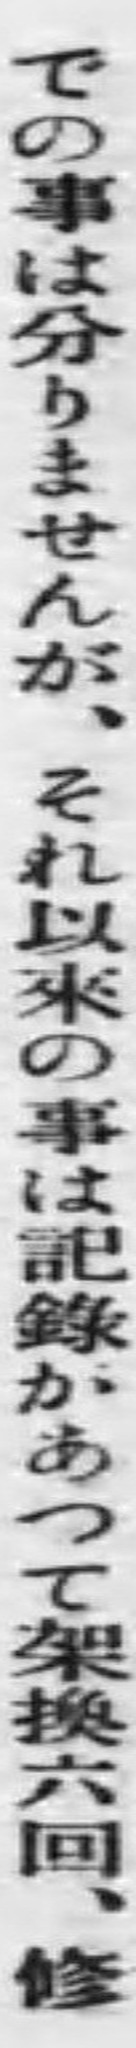での事は分りませんが、それ以来の事は記録があつて架換六回、修
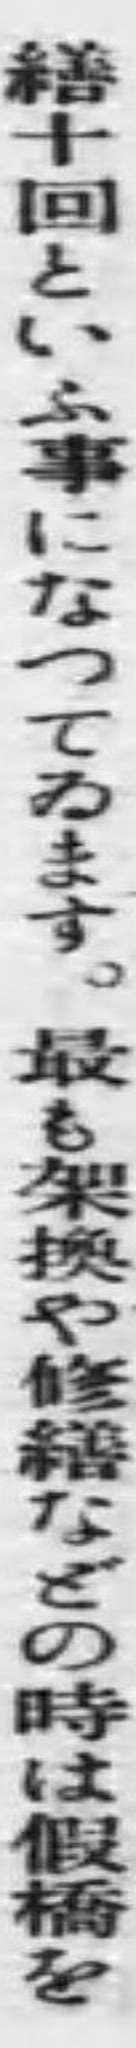繕十回といふ事になつてゐます。最も架換や修繕などの時は仮橋を
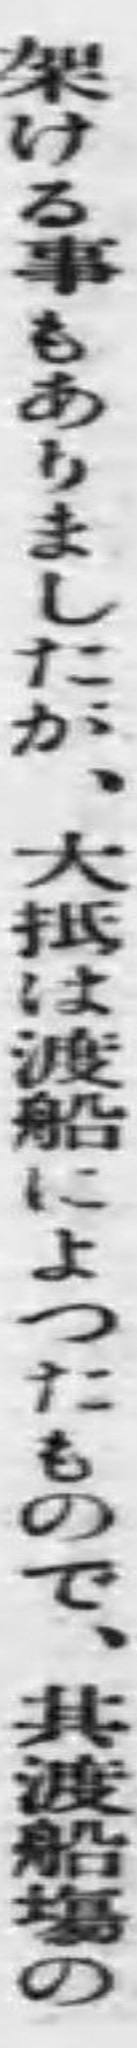架ける事もありましたが、大抵は渡船によつたもので、其渡船場の
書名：東三河道中記 : 豊橋市及其附近案内
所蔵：国立国会図書館 National Diet Library, JAPAN
